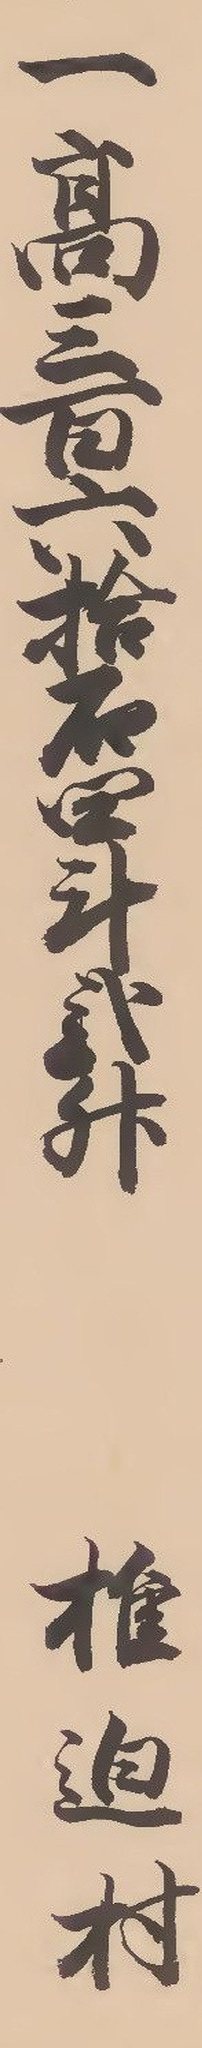一高三百六拾石四斗弐升椎迫村
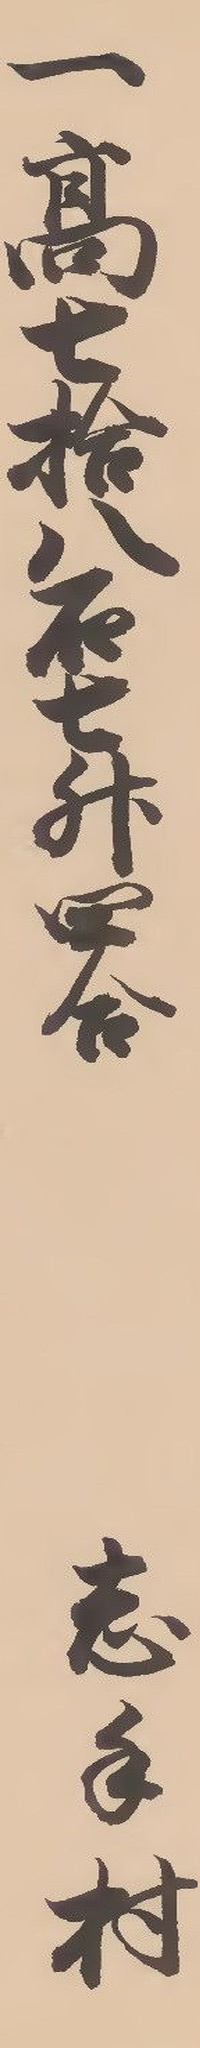一高七拾八石七升四合志手村
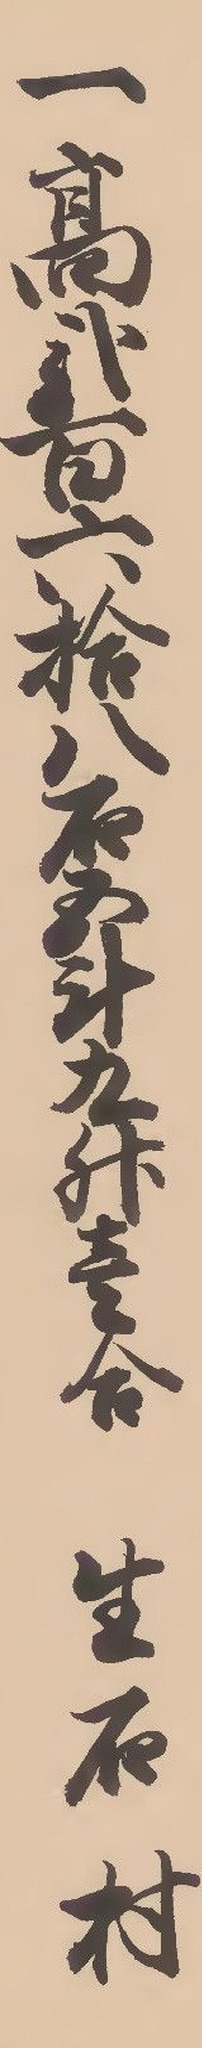一高弐百六拾八石五斗九升壱合生石村

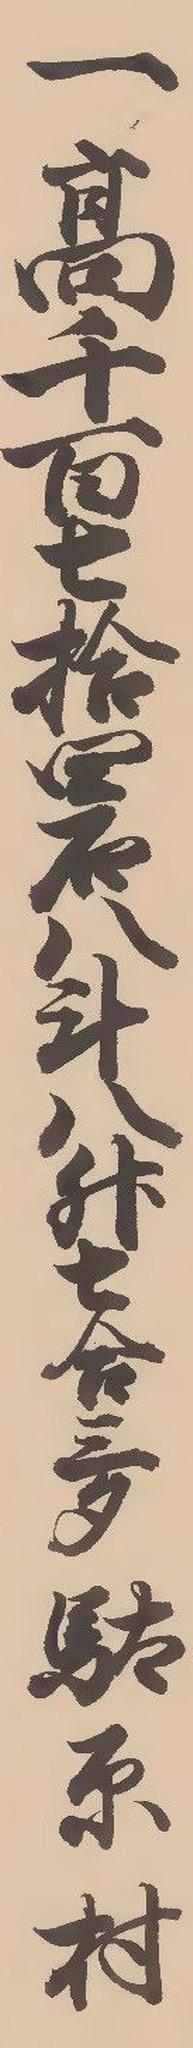一高千百七拾四石八斗八升七合三勺駄原村
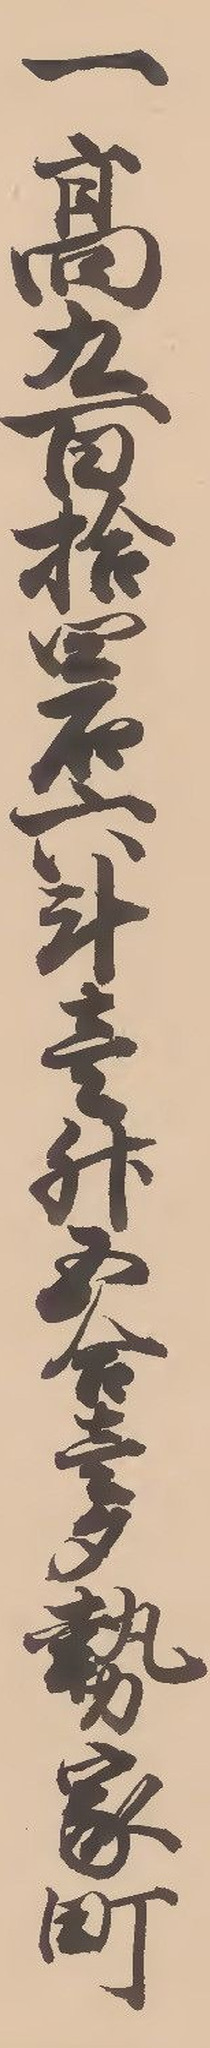一高九百拾四石六斗壱升五合壱勺勢家町
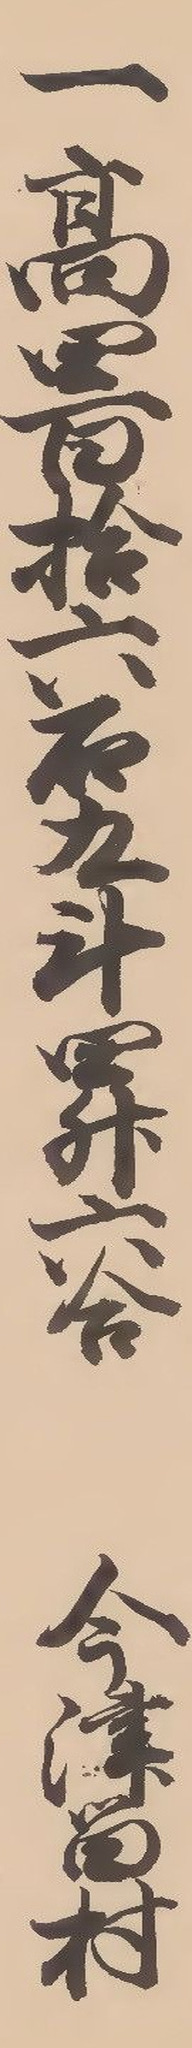一高四百拾六石九斗四升六合今津留村
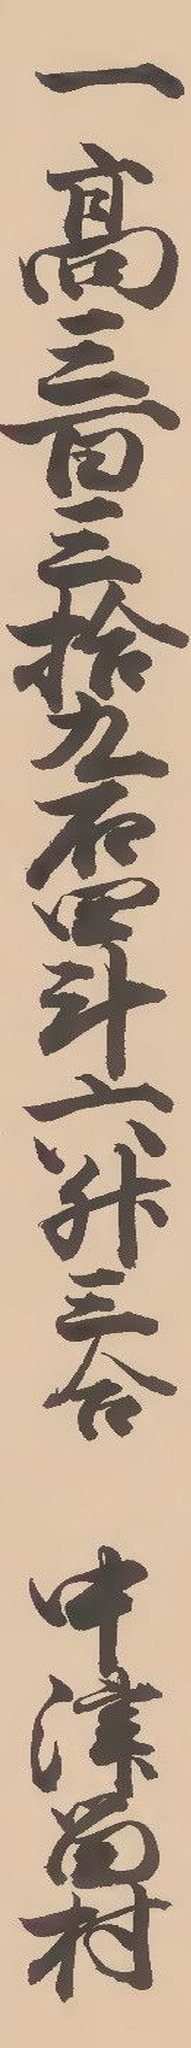一高三百三拾九石四斗六升三合中津留村
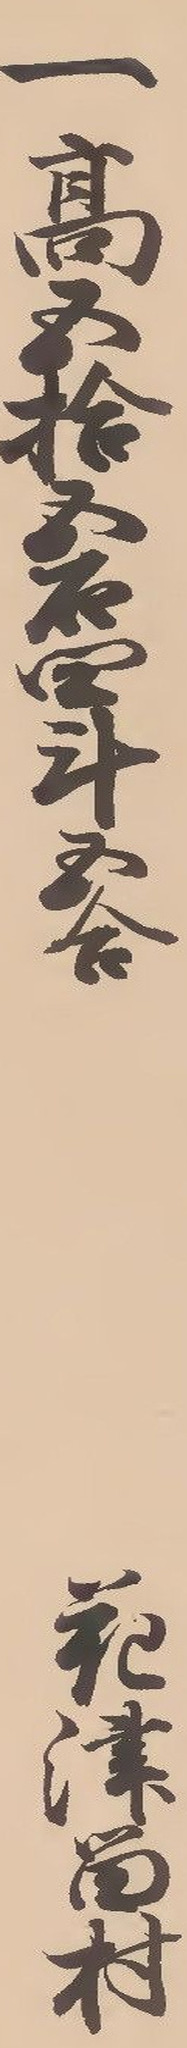一高五拾五石四斗五合花津留村
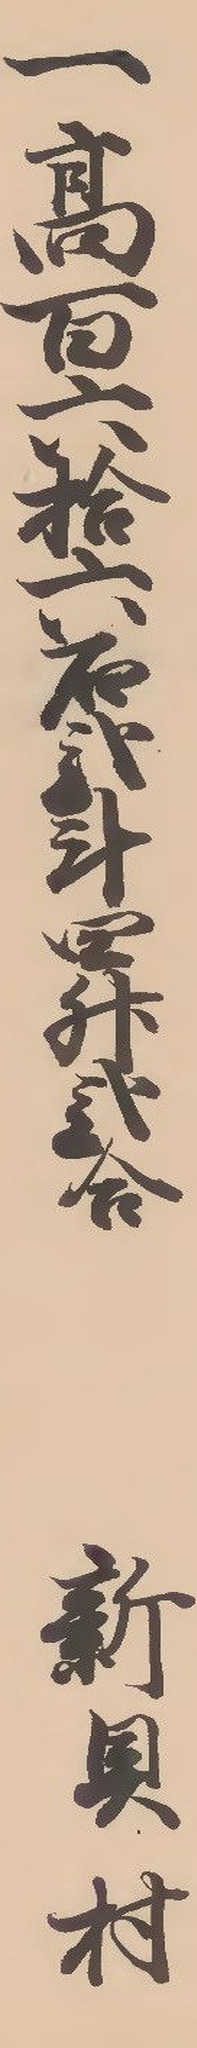一高百六拾六石弐斗四升弐合新貝村
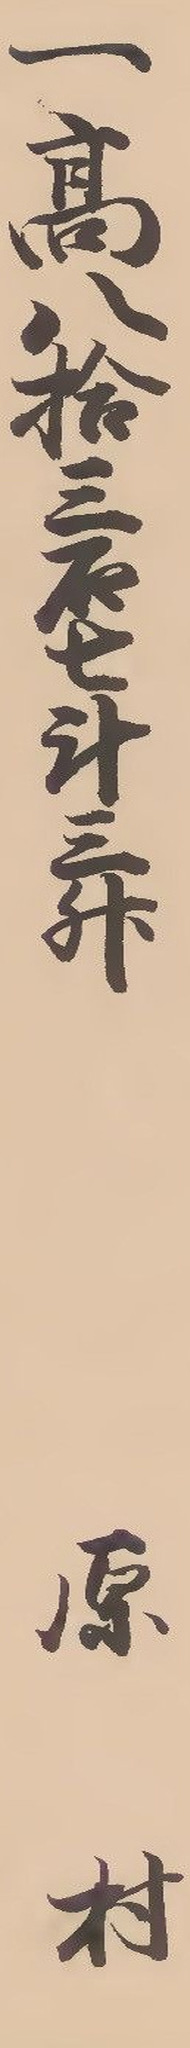一高八拾三石七斗三升原村

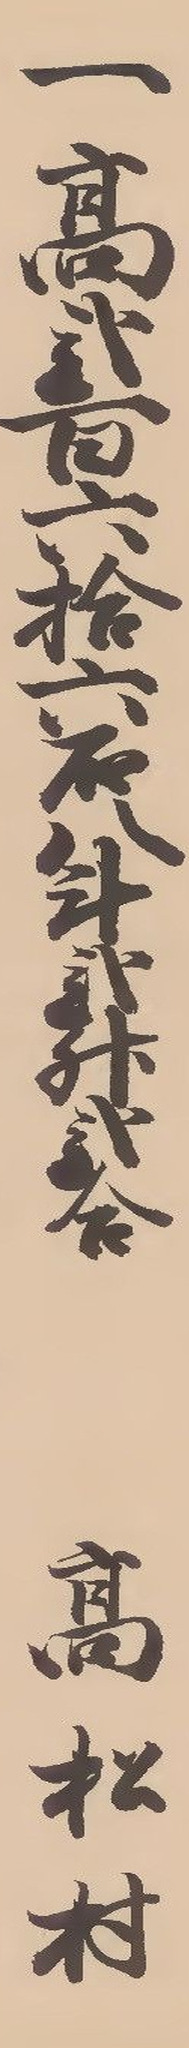一高弐百六拾六石八斗弐升弐合高松村
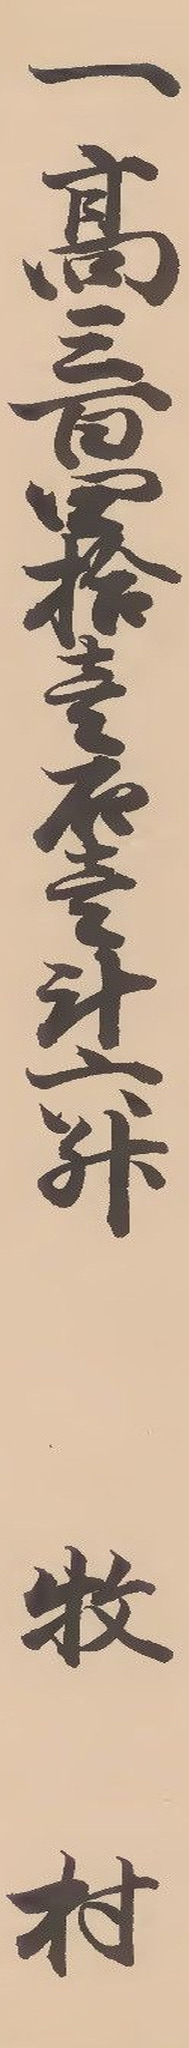一高三百四拾壱石壱斗六升牧村
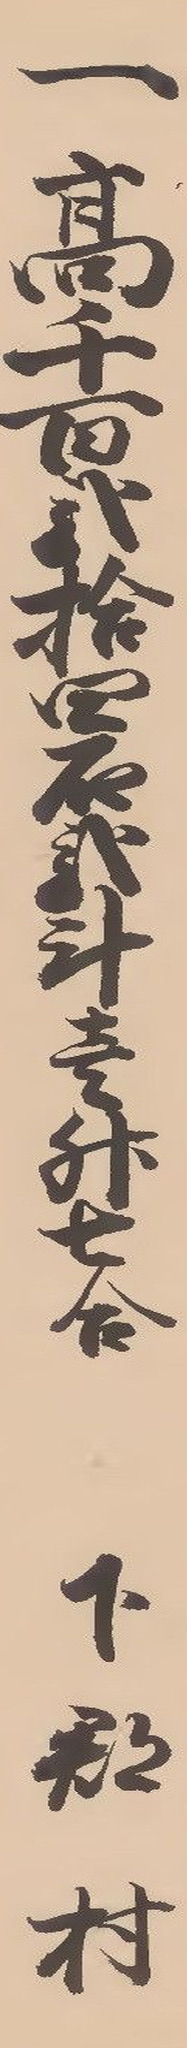一高千百弐拾四石弐斗壱升七合下郡村
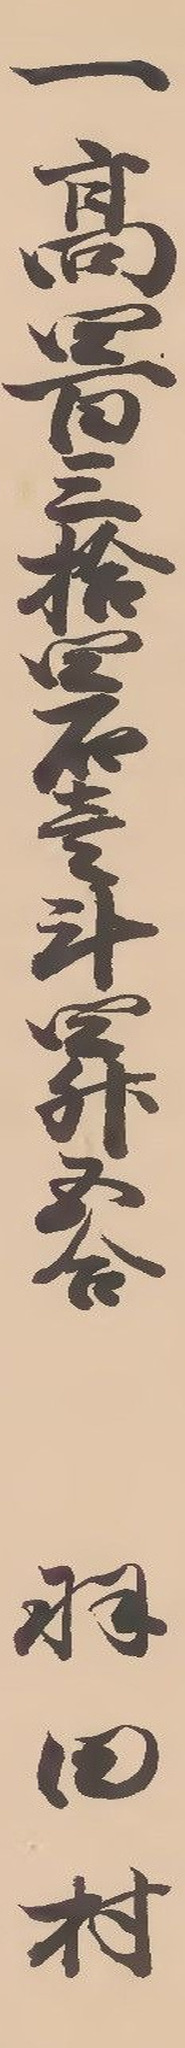一高四百三拾四石壱斗四升五合羽田村
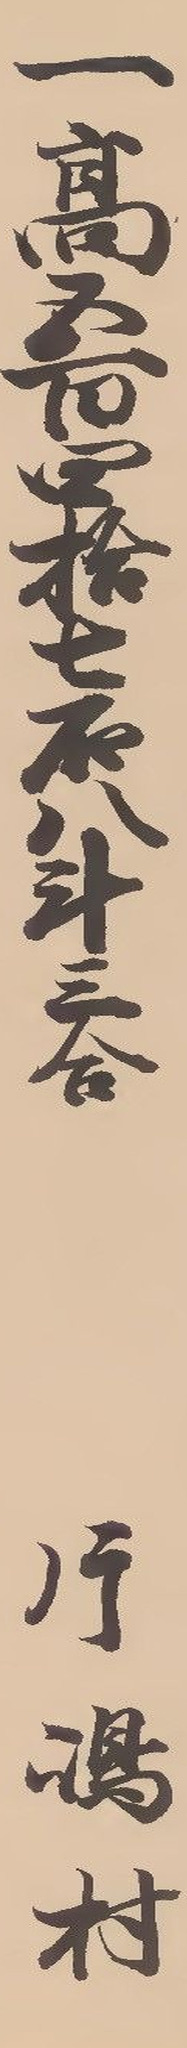一高五百四拾七石八斗三合片島村
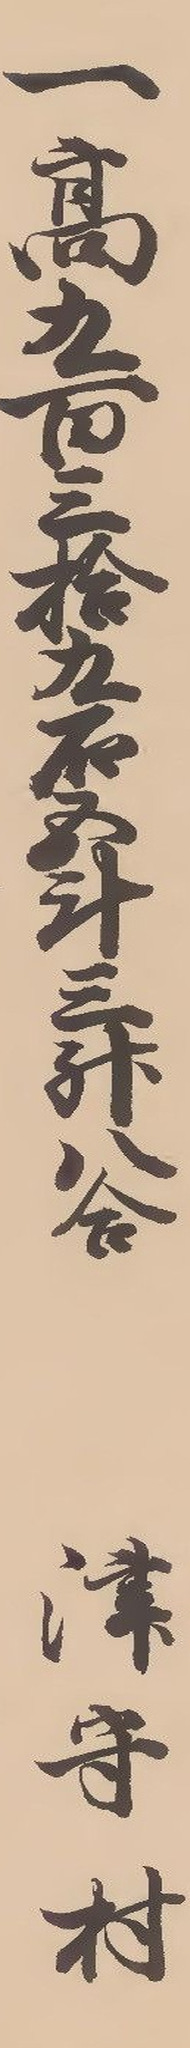一高九百三拾九石五斗三升八合津守村
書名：豊後国郷帳
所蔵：国立公文書館 National Archives of Japan
